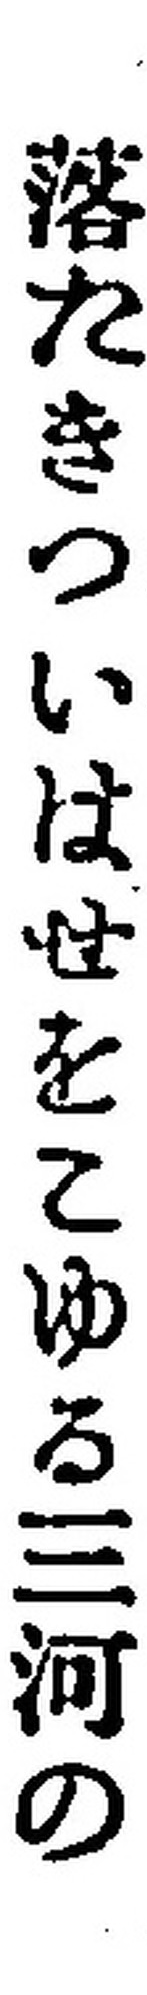落たきついはせをこゆる三河の
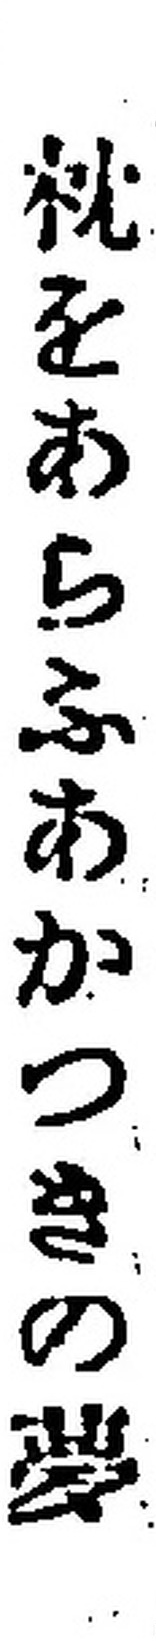枕をあらふあかつきの夢
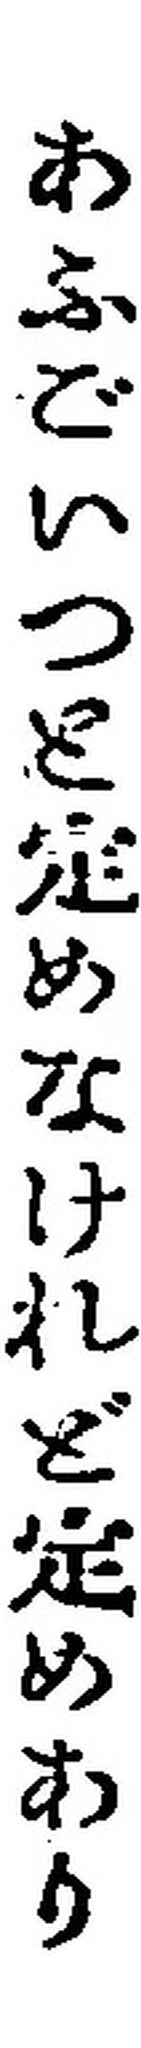あふごいつと定めなけれど定めあり
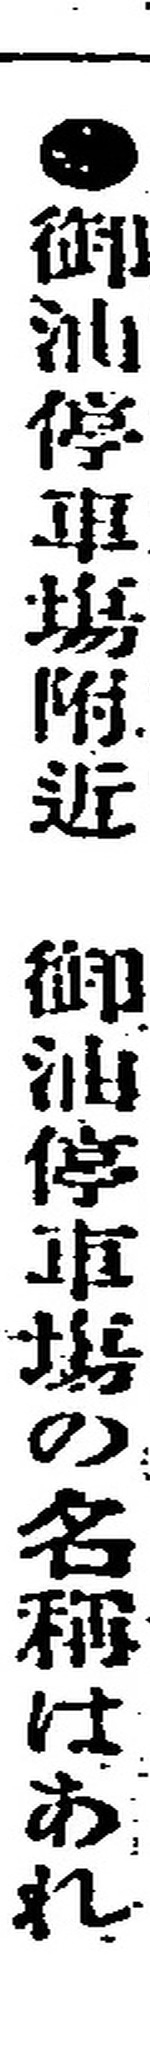●御油停車場附近御油停車場の名称はあれ
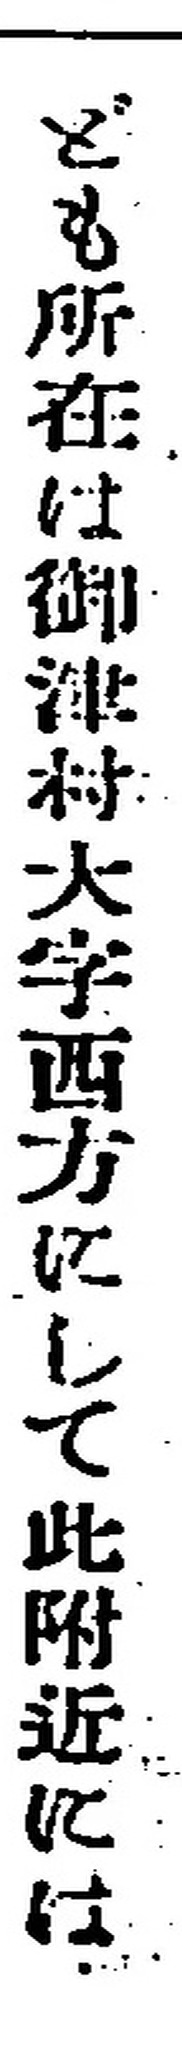ども所在は御津村大字西方にして此附近には
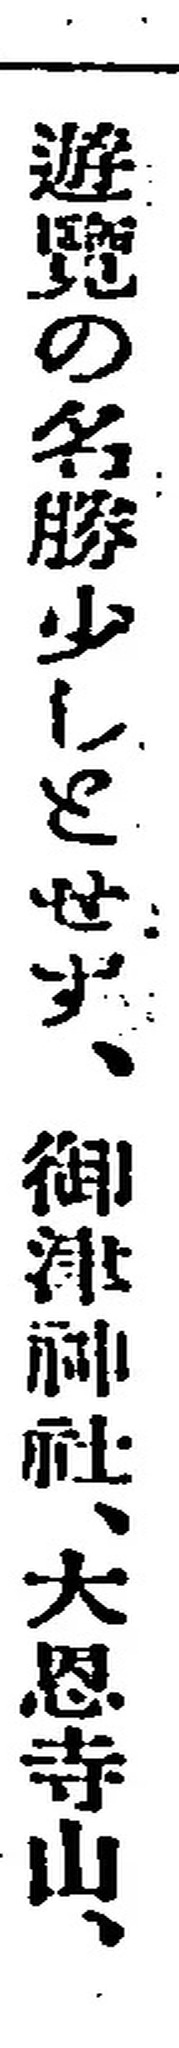遊覧の名勝少しとせず、御津神社、大恩寺山、
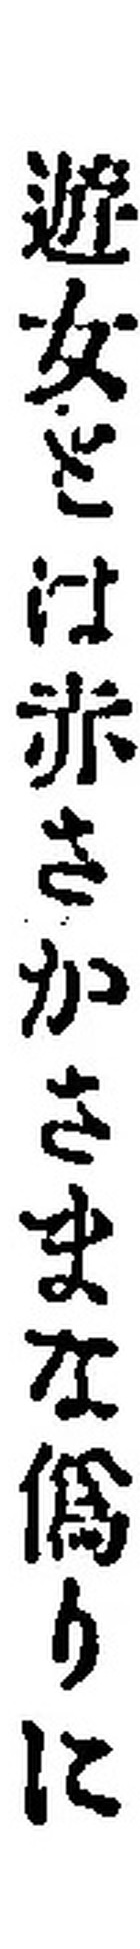遊女とは赤さかさまな偽りに
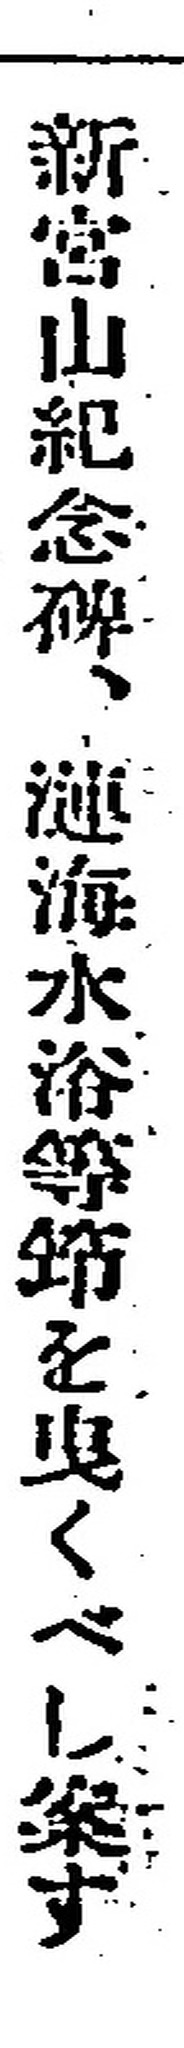新宮山紀念碑、漣海水浴場笻を曳くべし案す
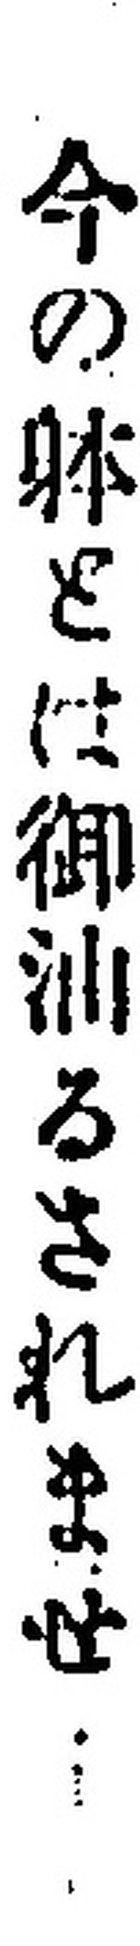今の体とは御油るされませ
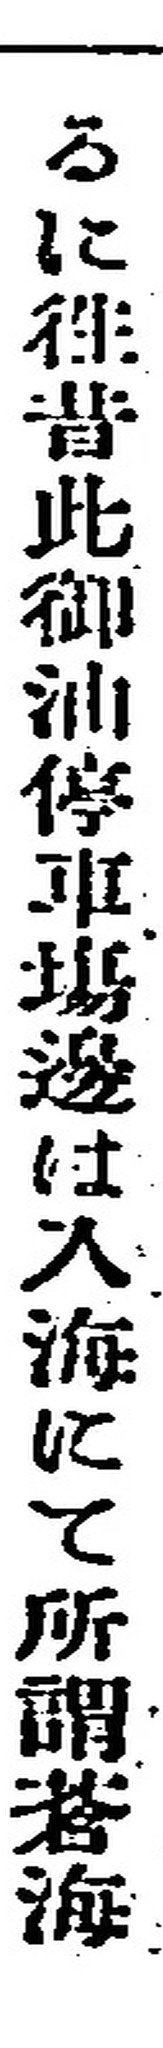るに往昔此御油停車場辺は入海にて所謂蒼海
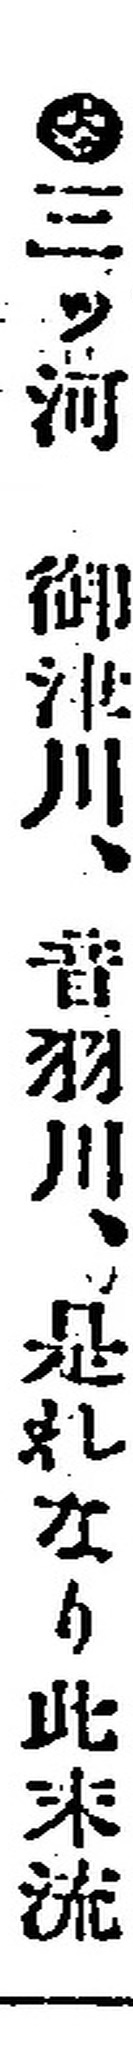●三ッ河御津川、音羽川、是れなり此末流
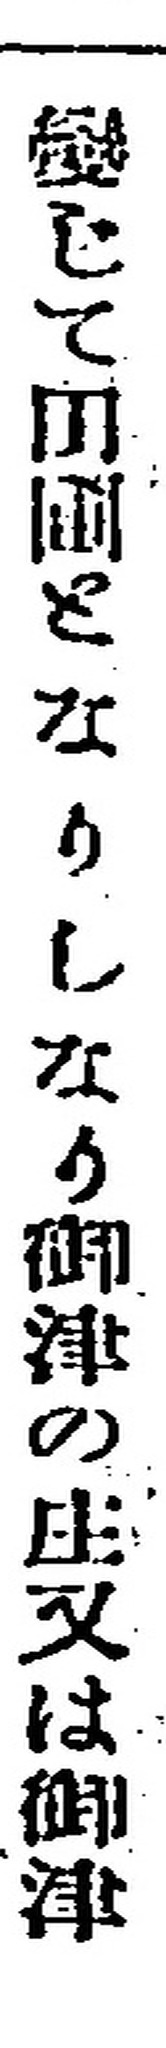変じて田圃となりしなり御津の庄又は御津
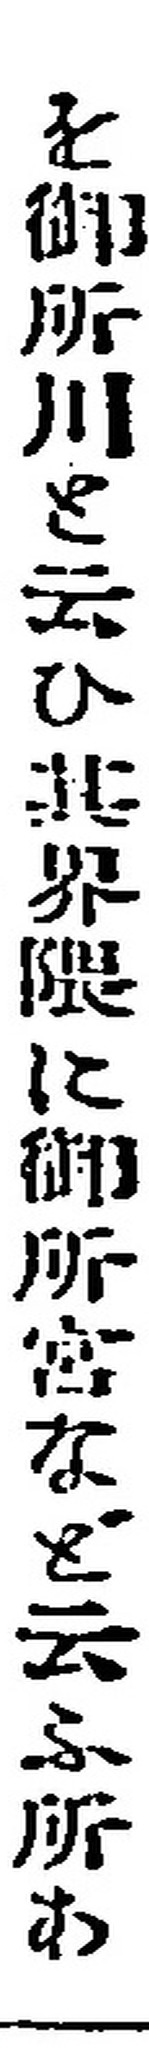を御所川と云ひ其界隈に御所宮など云ふ所あ
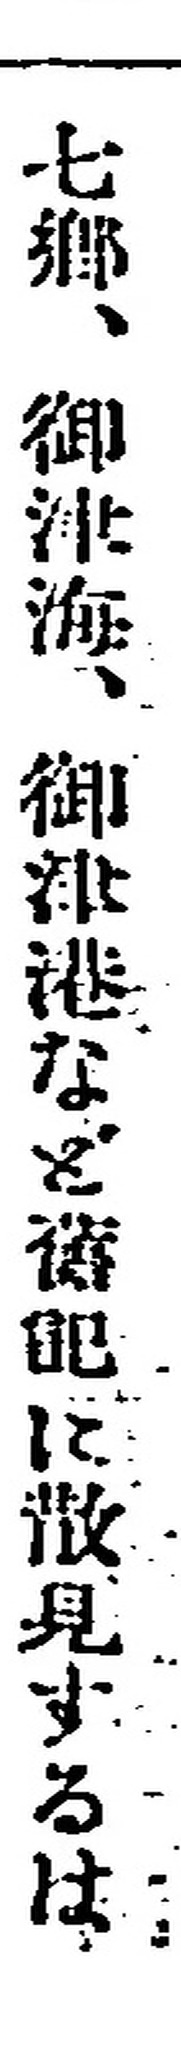七郷、御津海、御津港など旧記に散見するは
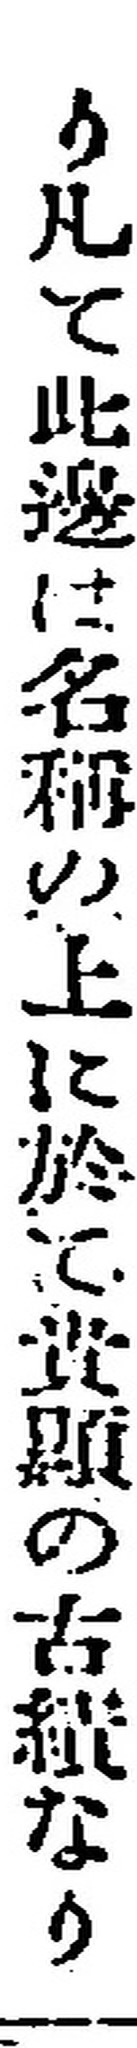り凡て此辺は名称の上に於て貴顕の古績なり
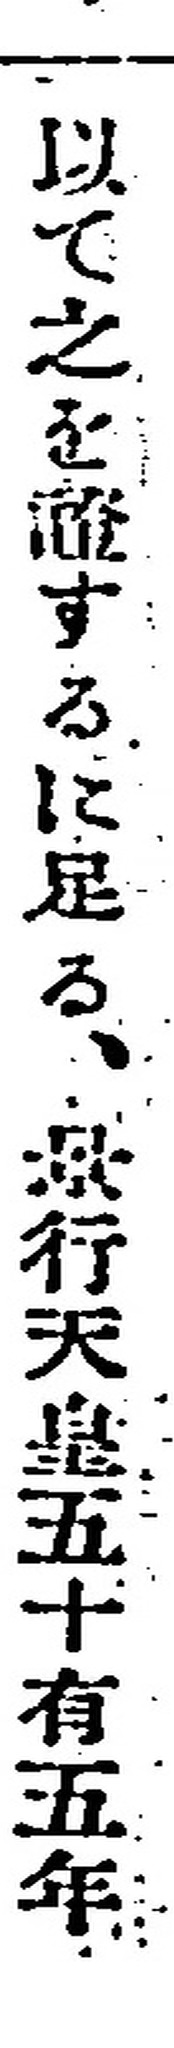以て之を証するに足る、景行天皇五十有五年
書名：東参名勝案内
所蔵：国立国会図書館 National Diet Library, JAPAN
